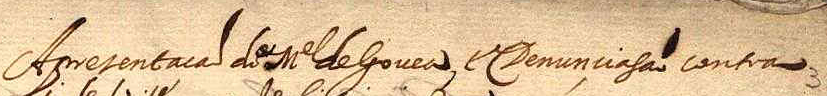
Apresentaçaõ do Mel de Gouea, e Denunciasaõ contra
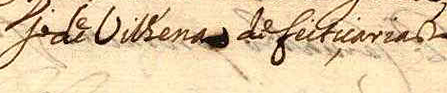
Jo de Vilhena de feitiçarias
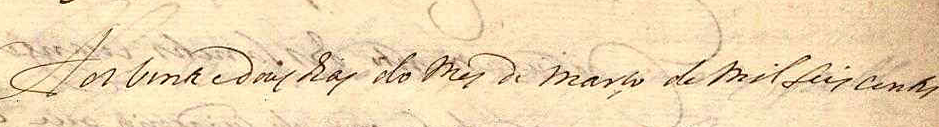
Aos vinte e dois dias do mes de março de mil seiscentos
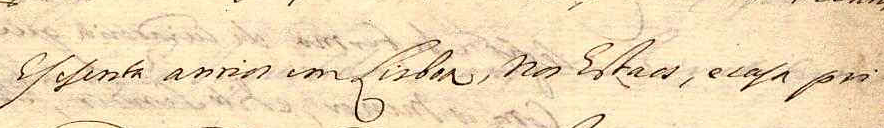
E sesenta annos em Lisboa nos Estaos, e casa pri
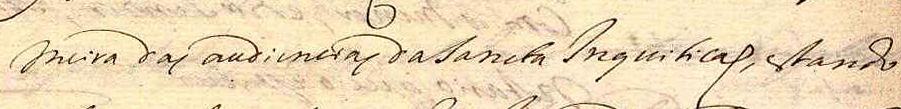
meira das audiencias da sancta Inquisiçaõ, estando
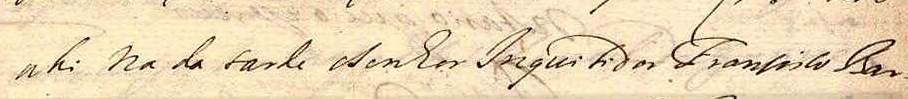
ahi na da tarde o senhor Inquisidor Francisco Bar
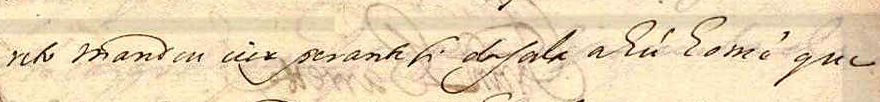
reto mandou uir perante si da sala a hū homē que
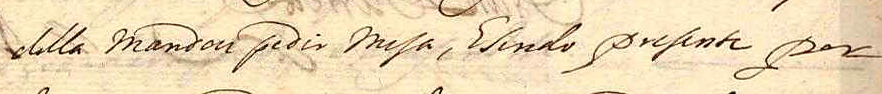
della mandou pedir mesa, E sendo presente por
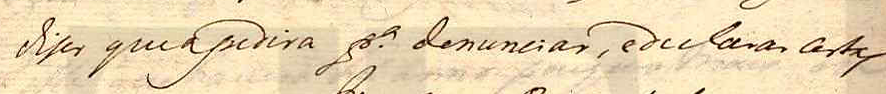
diser que a pedira p.a denunciar, e declarar certas
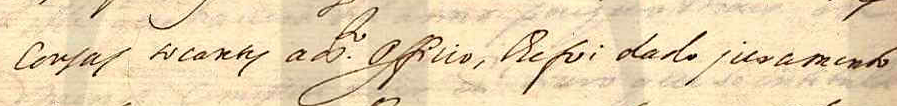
cousas tocantes ao s.to Officio, lhe foi dado juramento
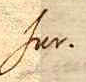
Jur.
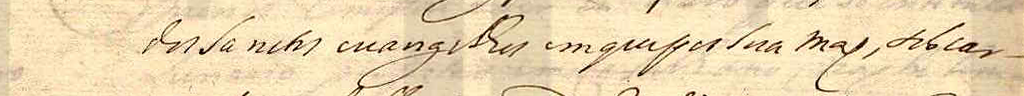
dos Sanctos euangelhos em que pos sua maõ, sob car
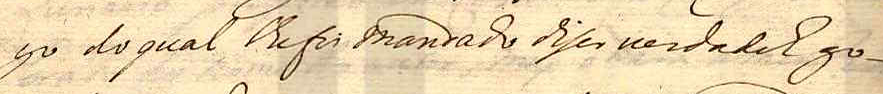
go do qual lhe foi mandado diser uerdade E go
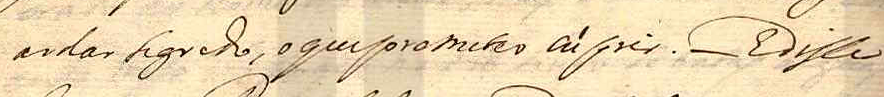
ardar segredo, o que prometeo cūprir. - E disse
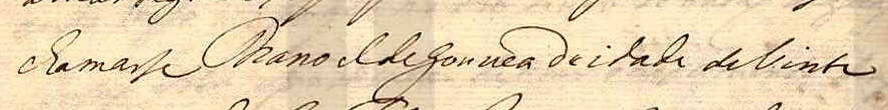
chamarse Manoel de Gouuea de idade de Vinte
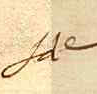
Ide
